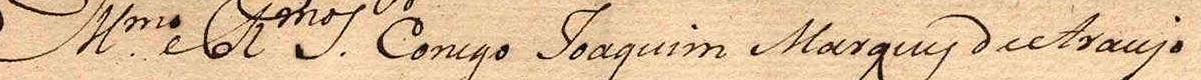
Ill.mo e R.mo S.or Conego Ioaquim Marques de Araujo
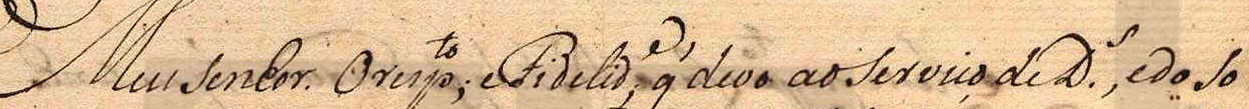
Meu Senhor. O resp.to; e Fidelid;e q̄ devo ao Serviço de D.s, e do So
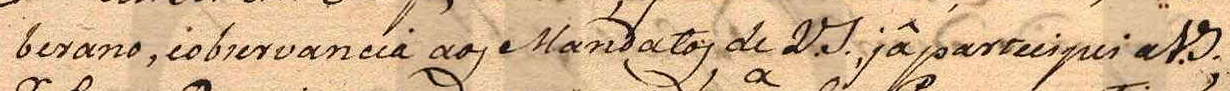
berano, e observancia aos Mandatos de V.S. já partecipei a V.S.
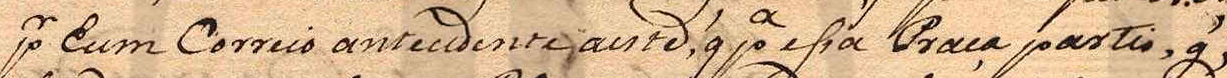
p.r hum Correio antecedente a este, q̄ p.a essa Praça partio, q̄,
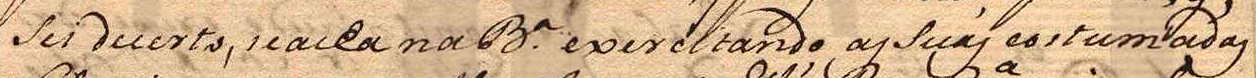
Sei decerto, se acha na B.a exercitando as suas costumadas
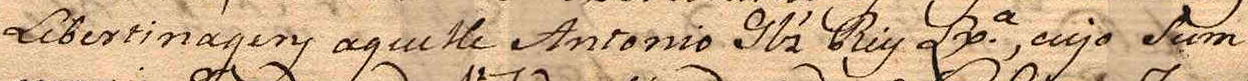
Libertinagens aquelle Antonio Glz̄ Reis Lx.a, cujo Sum
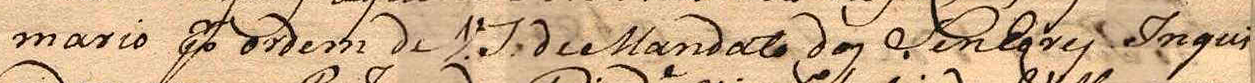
mario p.r ordem de V.S. de Mandato dos Senhores Inqui
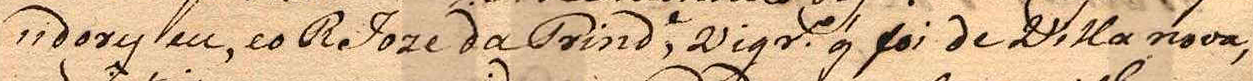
sidores eu, e o R Joze da Trind.e, Vigr.o q̄ foi de Villa nova,
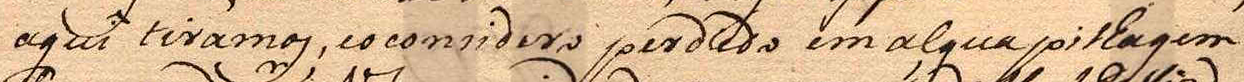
aqui tiramos, e o considero perdido em algua pilhagem
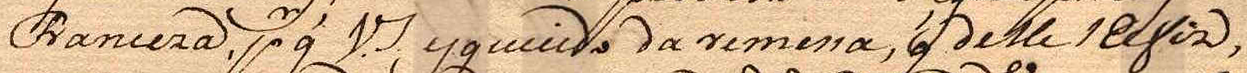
Franceza, p.r q̄ V.S. esquecido da remessa, q̄ delle lhe fiz,
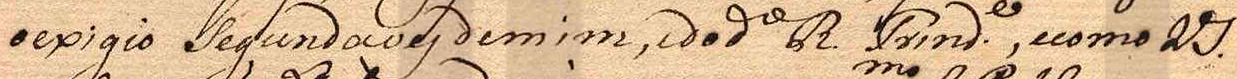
o exigio segunda ves de mim, e do d.o R Trind.e, e como VS.
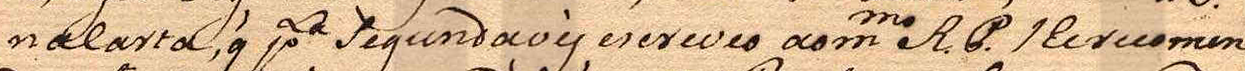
na Carta, q̄ p.La segunda vés escreveo ao m.mo R. P. lhe recomen
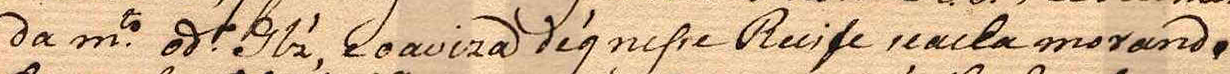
da m.to o d.o Glz̄, e o aviza de q̄ nesse Recife se acha morando
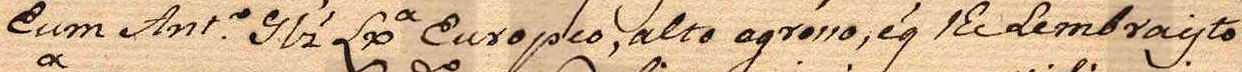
hum Ant.o Glz̄ Lx.a Europeo, alto a grosso, e q̄ lhe Lembra isto
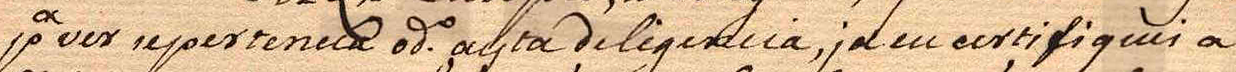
p.a ver se pertencia o d.o a esta deligencia, ja eu certifiquei a
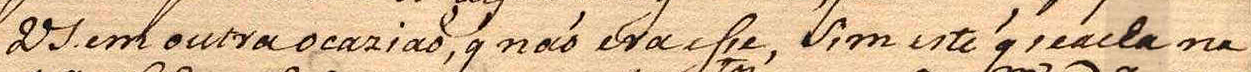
VS. em outra ocaziaõ, q̄ naõ era esse, sim este q̄ se acha na
